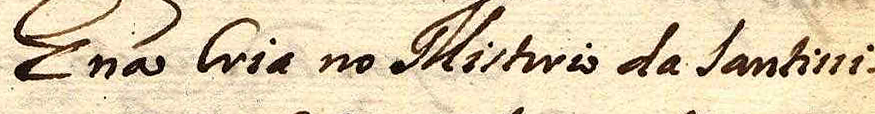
E não Cria no Misterio da Santissi
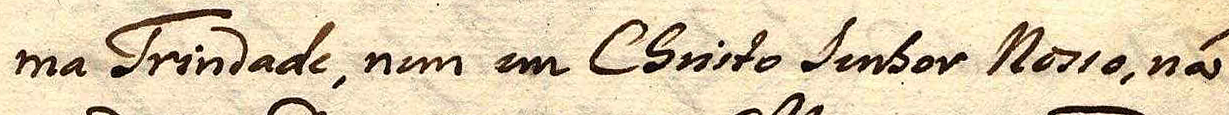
ma Trindade, nem em Christo Senhor Nosso, não
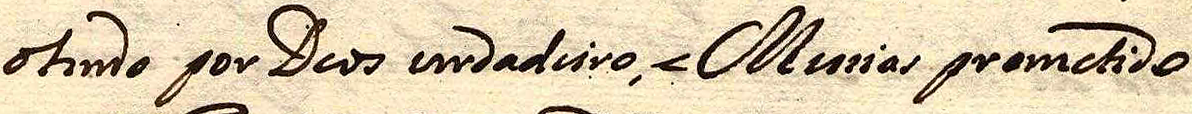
o tendo por Deos verdadeiro, e Messias prometido
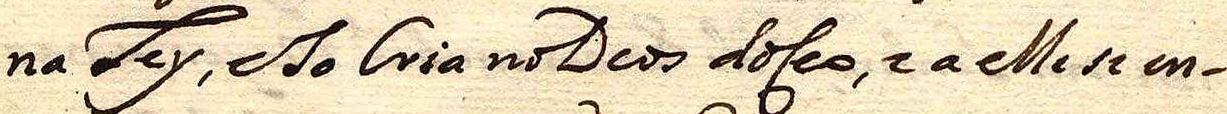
na Ley, e so Cria no Deos do Ceo, e a elle se en
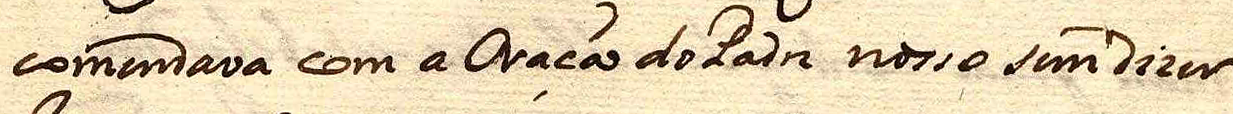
comendava com a Oração do Padre nosso sem dizer
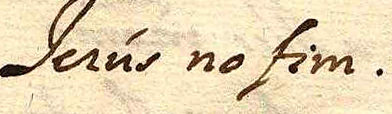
Iezús no fim.
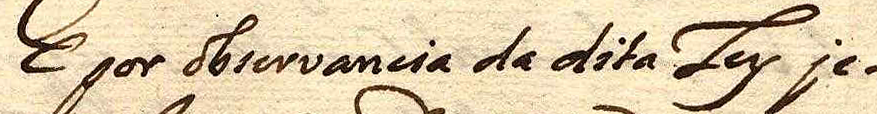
E por observancia da dita Ley je
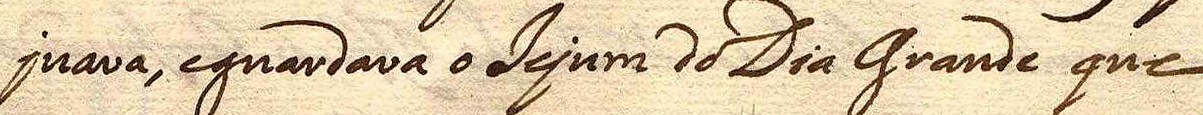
juava, e guardava o Jejum do Dia Grande que
